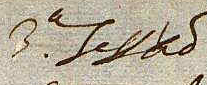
3.a sessaõ
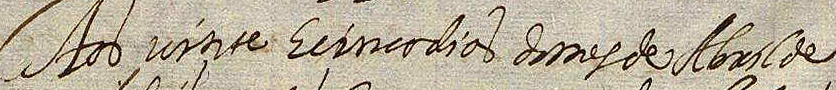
Aos uinte E cinco dias do mes de Abril de
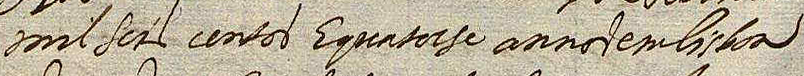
mil seiscentos E quatorse annos em lisboa
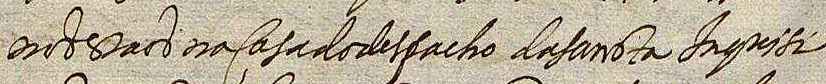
nos estaos na Casa do despacho da sancta Inquisi
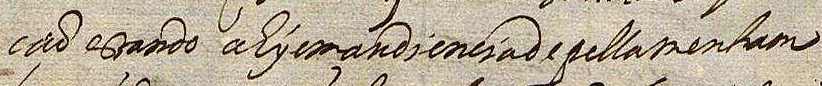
çaõ estando ahy em audiencia de pella menham
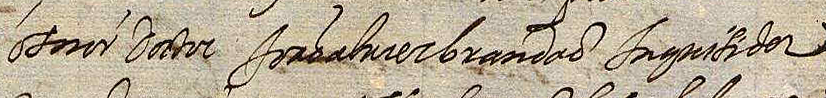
o snor̄ Doctor Joaõ alurez brandaõ Inquisidor
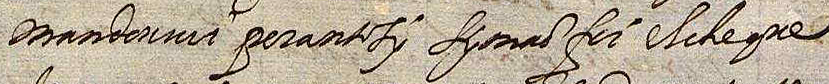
mandou uir perante sy Symaõ frz̄ elche que
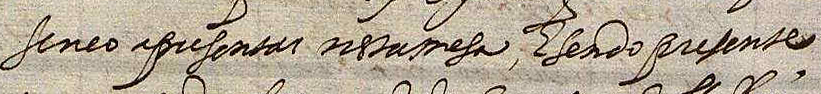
se ueo apresentar nesta mesa, E sendo presente
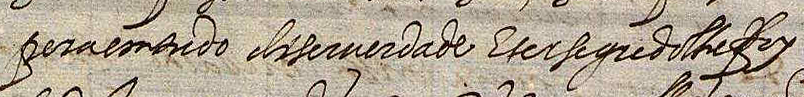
pera em tudo diser uerdade E ter segredo lhe foy
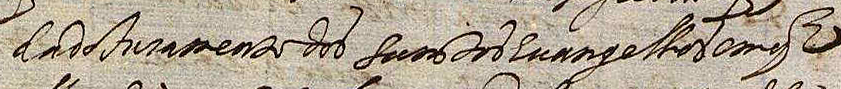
dado Iuramento dos sanctos Euangelhos em q̄
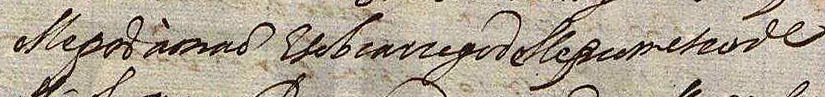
elle pos a maõ E sob carrego delle prometeo de
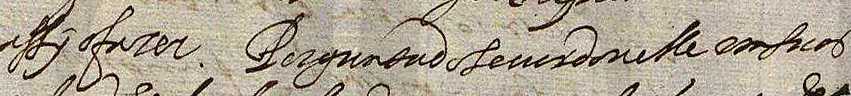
assy o fazer. Perguntado se cuidou elle em suas
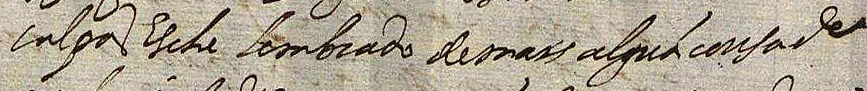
culpas E se he lembrado de mais alguā cousa de
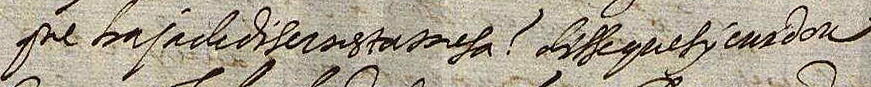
que haja de dizer nesta mesa? disse que sy cuidou
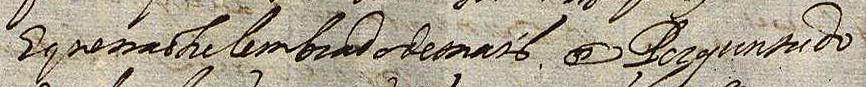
E que naõ he lembrado de mais. ⁋ Perguntado
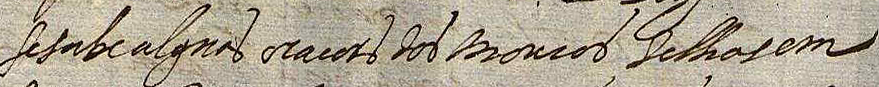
se sabe alguas oraçois dos mouros, se lhas em
